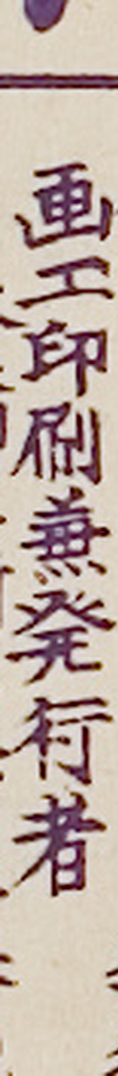画工印刷兼発行者
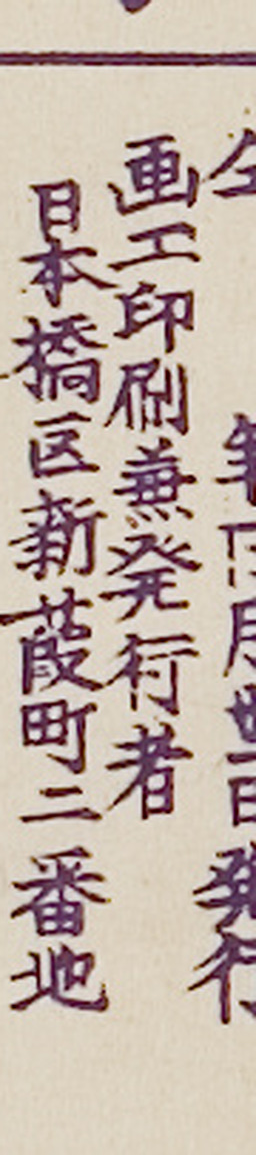日本橋区新葭丁二番地
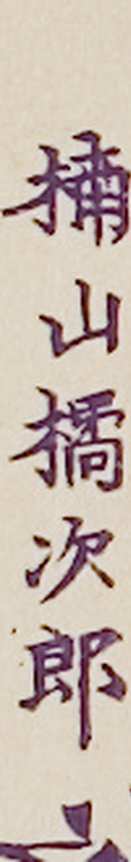楠山橘次郎
